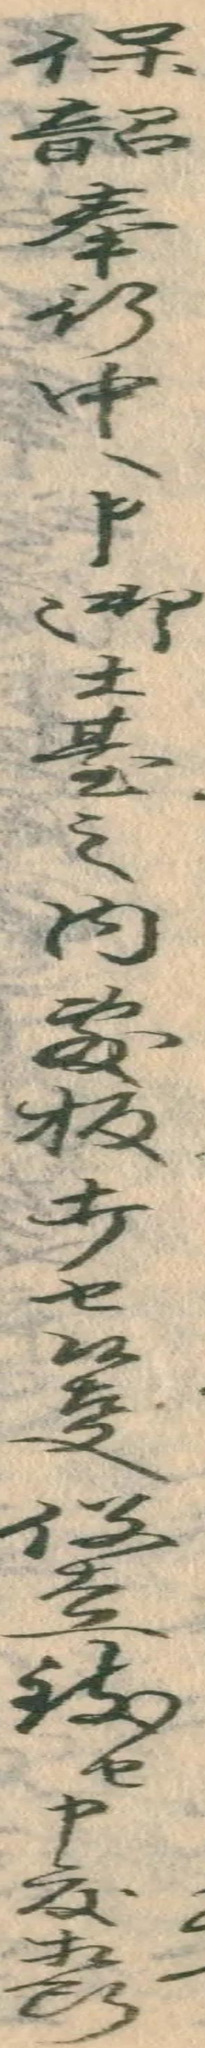保韶奉行中へ申御土台之内敷板打セ候事役大工致セ申度相断
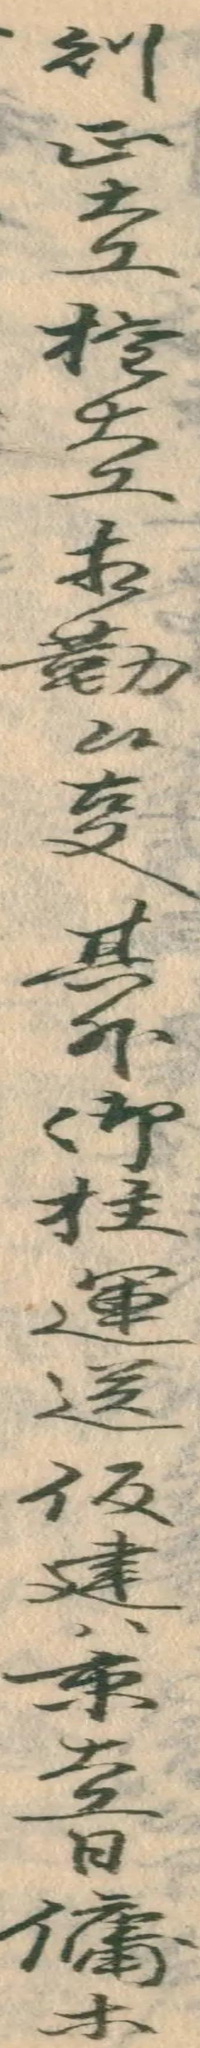則正大工権大工相勤候事其外御柱運送仮建ハ京大工日傭等
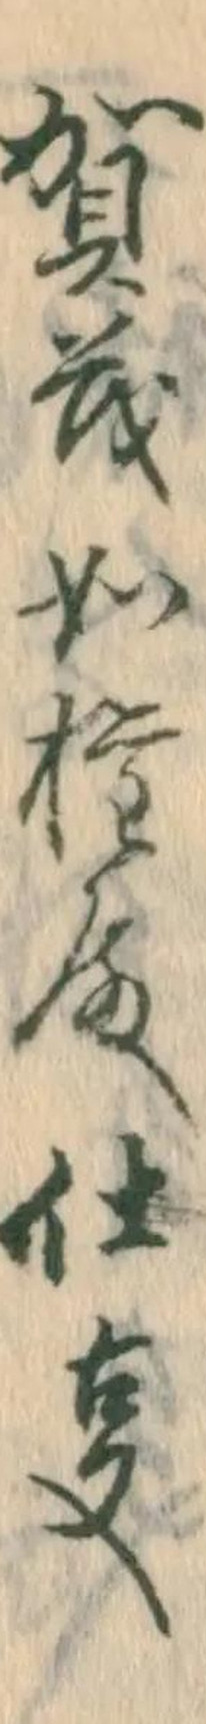賀茂如権殿仕事
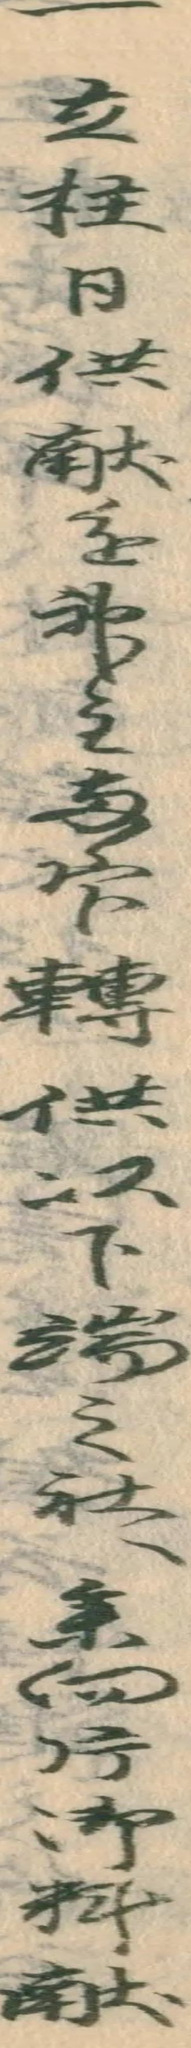一立柱日供献進神主両官転供以下端之社へ参向片御料献
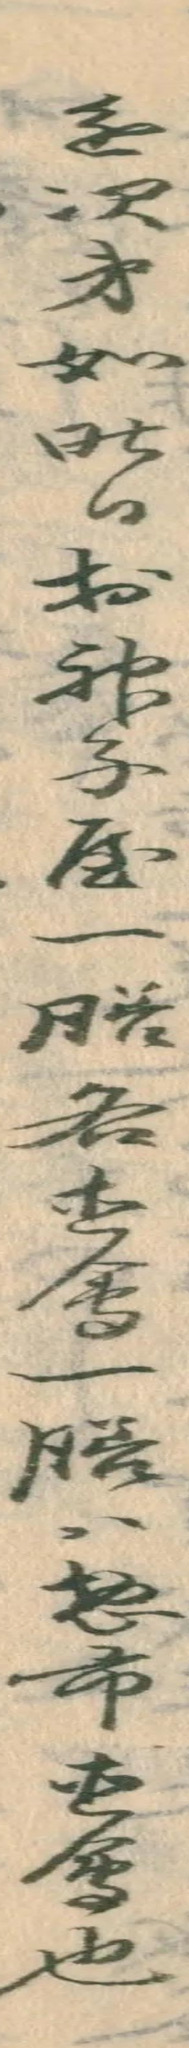進次第如昨日於神子屋一膳各直会一膳ハ惣市直会也
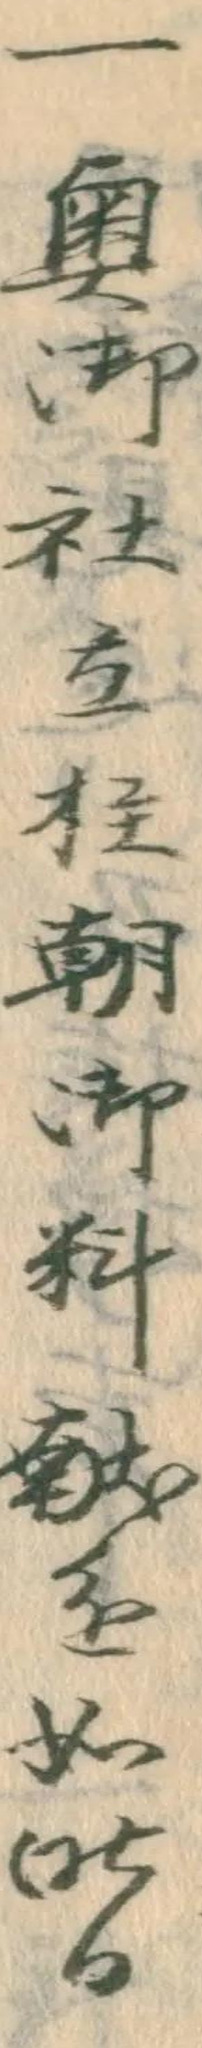一奥御社立柱朝御料献進如昨日
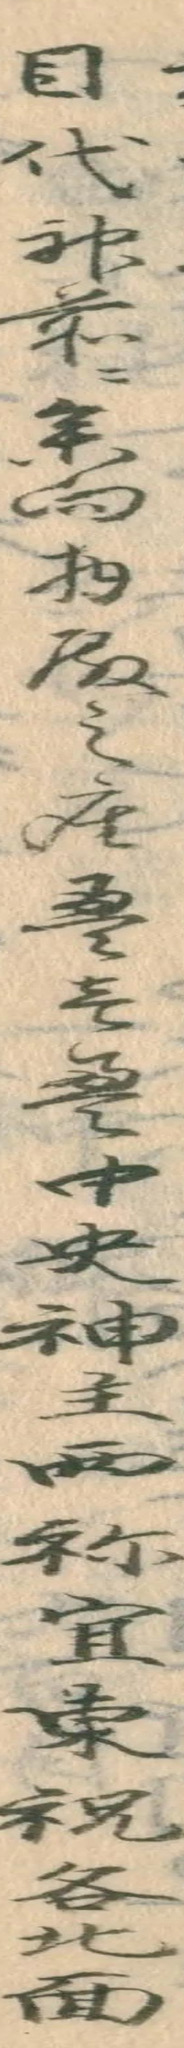目代神前ニ参向拝殿之座畳壱畳中央神主西祢宜東祝各北面
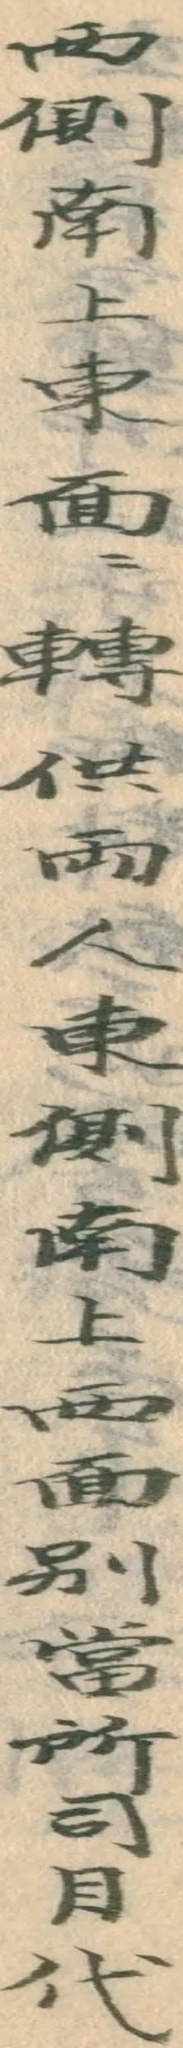西側南上東面ニ転供両人東側南上西面別当所司目代
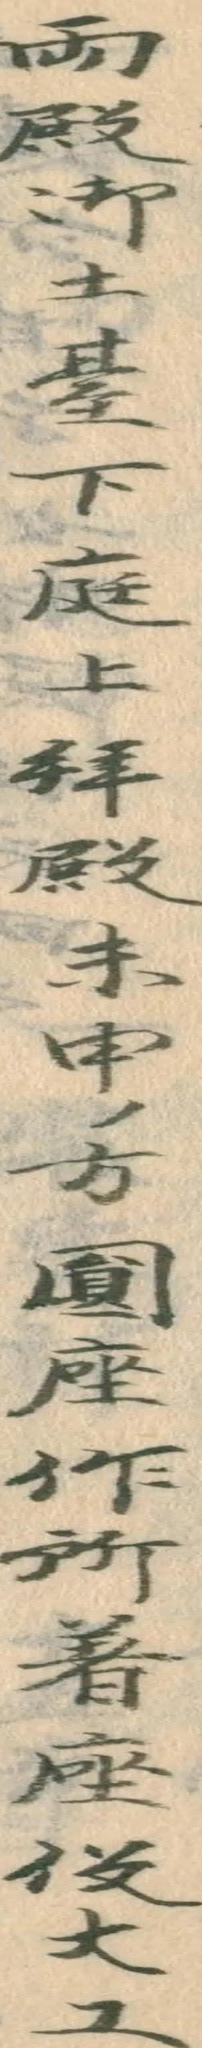両殿御土台下庭上拝殿未申ノ方円座作所着座役大工
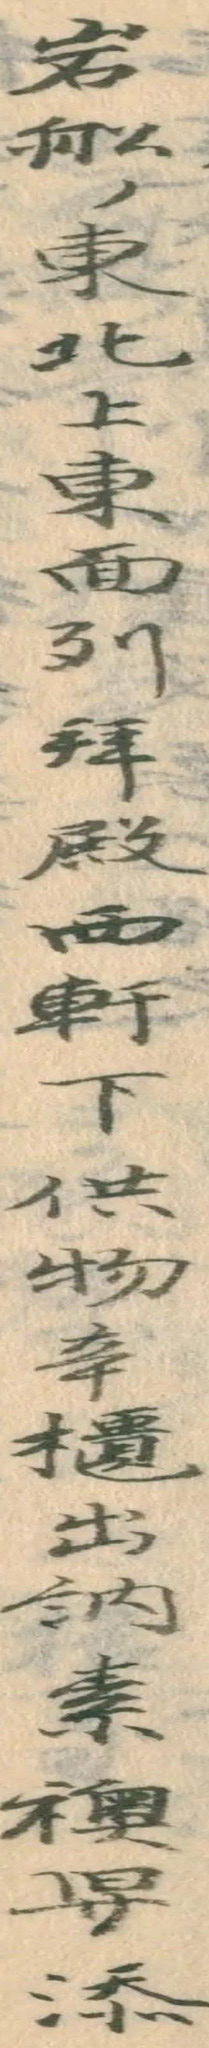岩船ノ東北上東面列拝殿西軒下供物辛櫃出納素襖舁添
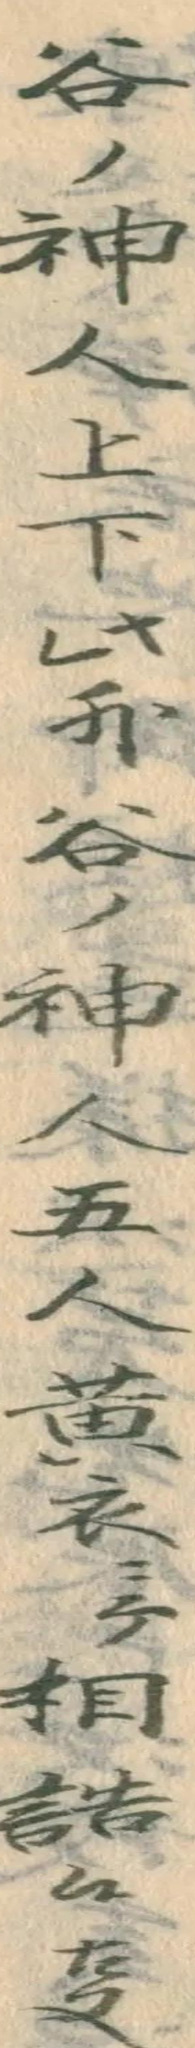谷ノ神人上下此外谷ノ神人五人黄衣ニ而相詰候事
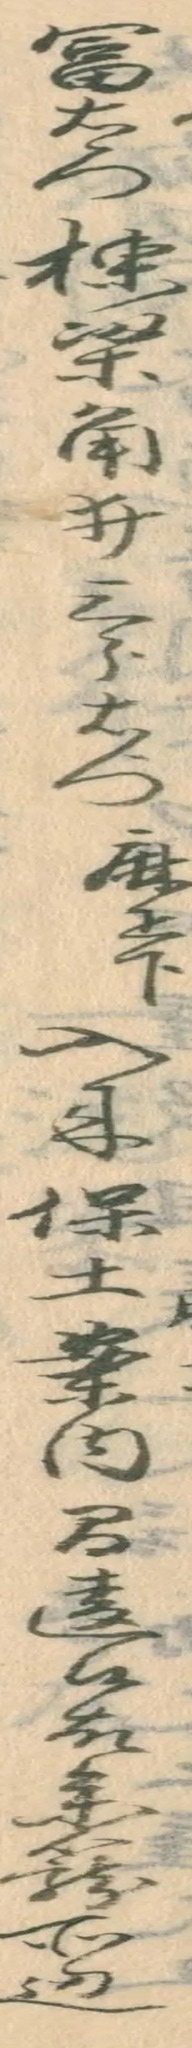富右衛門棟梁角井三郎太郎麻上下入来保土案内間違候故参籠所辺

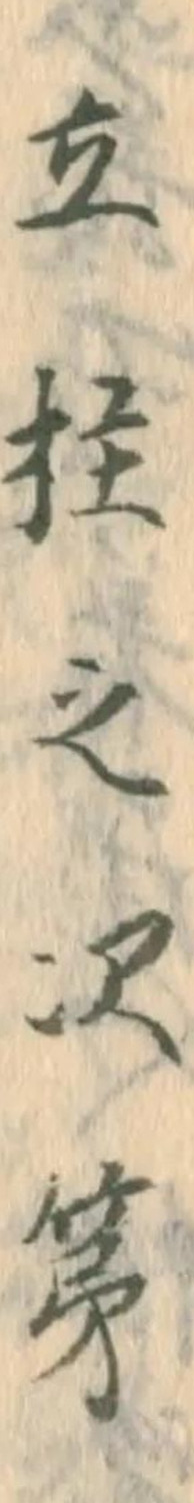立柱之次第
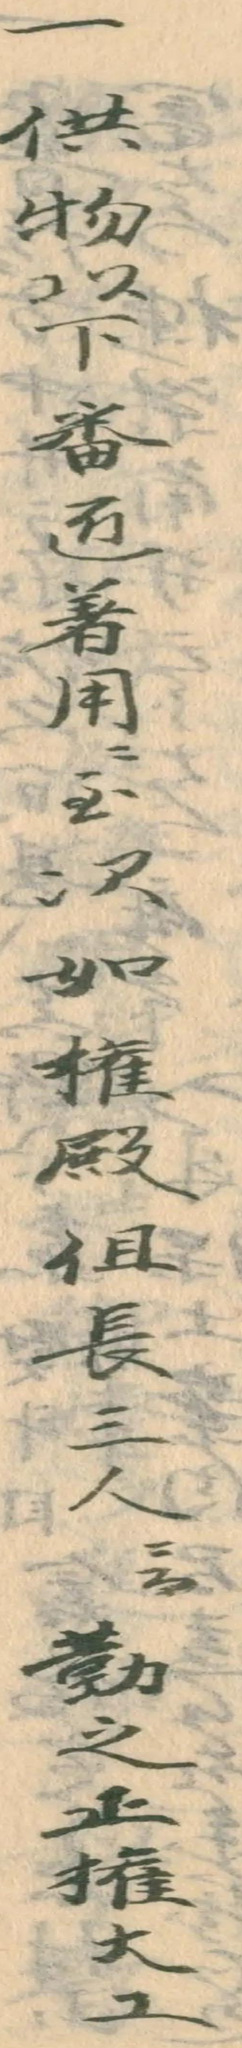一供物以下番匠着用ニ至次如権殿但長三人ニ而勤之正権大工
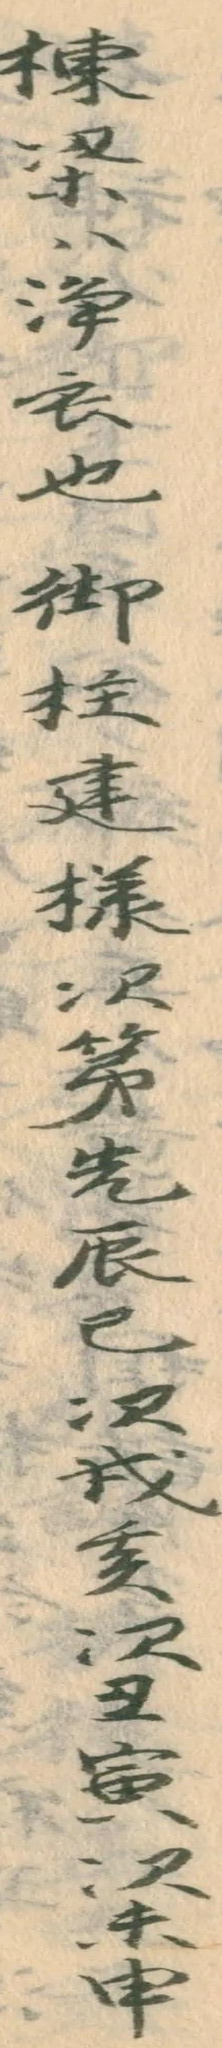棟梁ハ浄衣也御柱建様次第先辰巳次戌亥次丑寅次未申
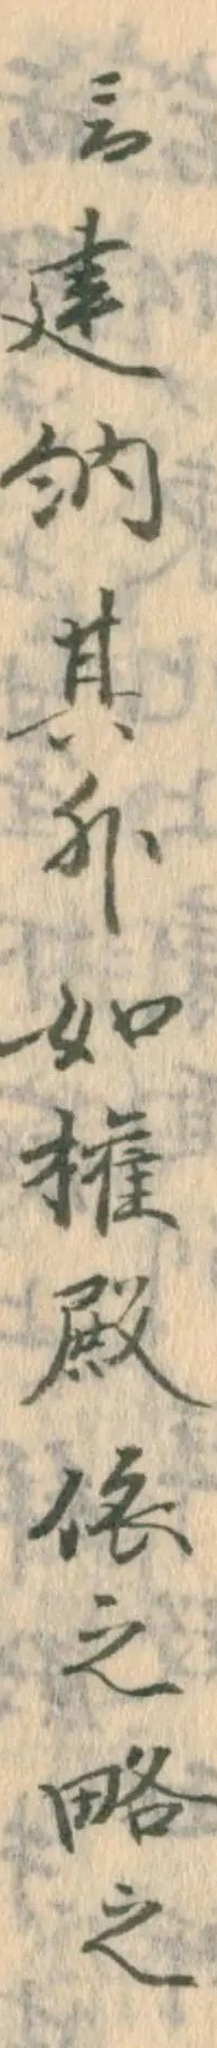ニ而建納其外如権殿依之略之
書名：賀茂社記録. 第17冊
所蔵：国立国会図書館 National Diet Library, JAPAN
